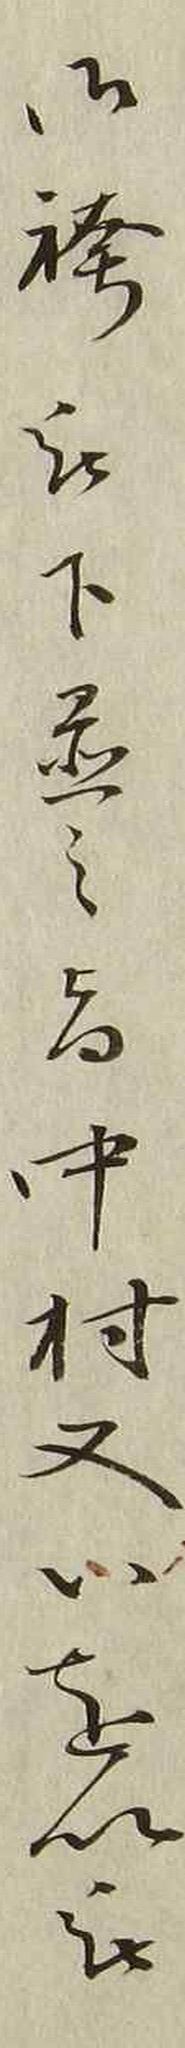御袴被下置候旨中村又八を以被
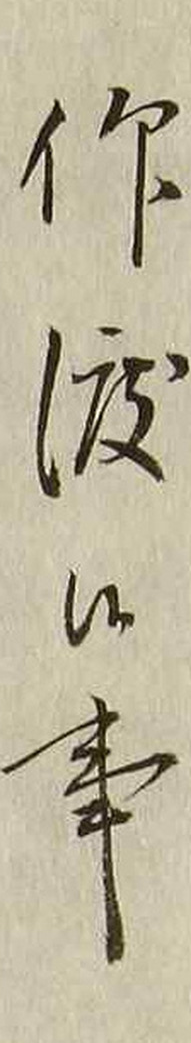仰渡候事
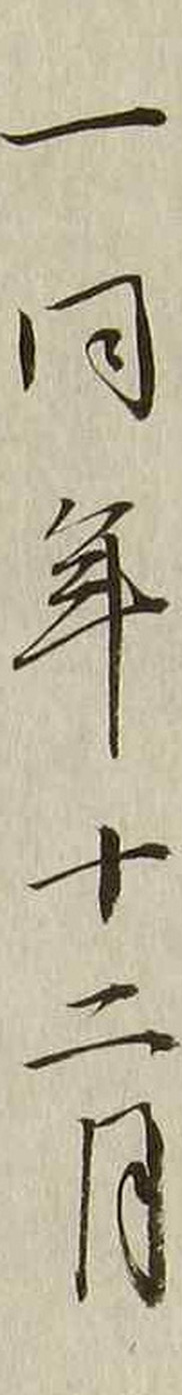一同年十二月
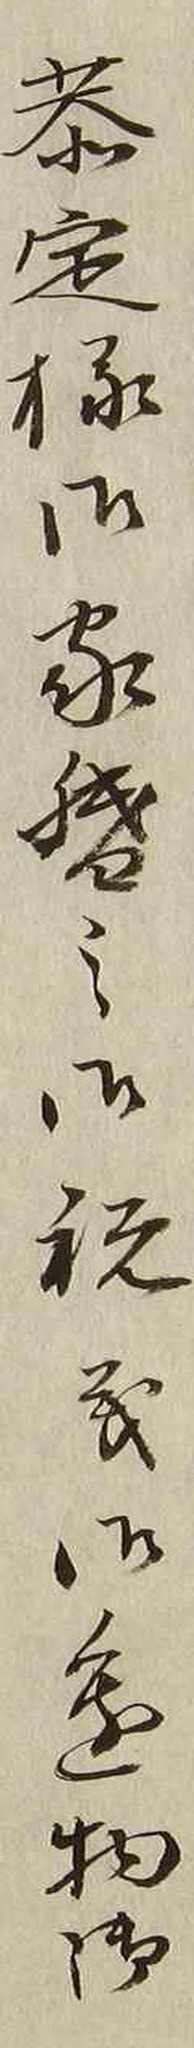恭定様御家督之御祝儀御懸物御
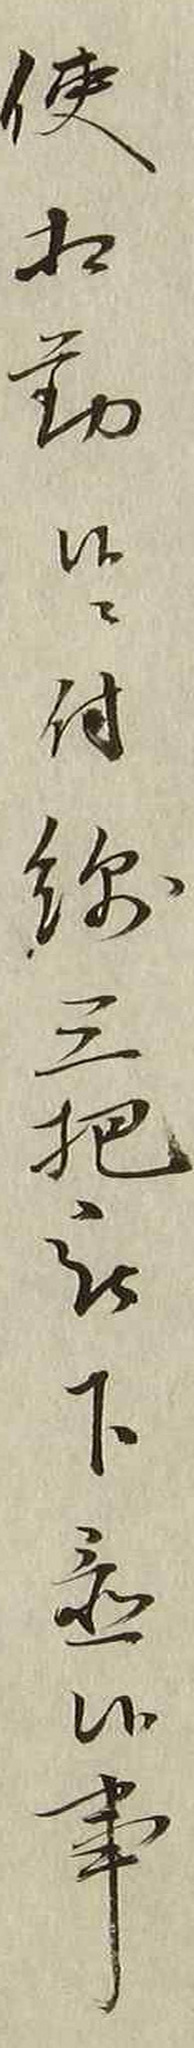使相勤候ニ付綿三把被下置候事
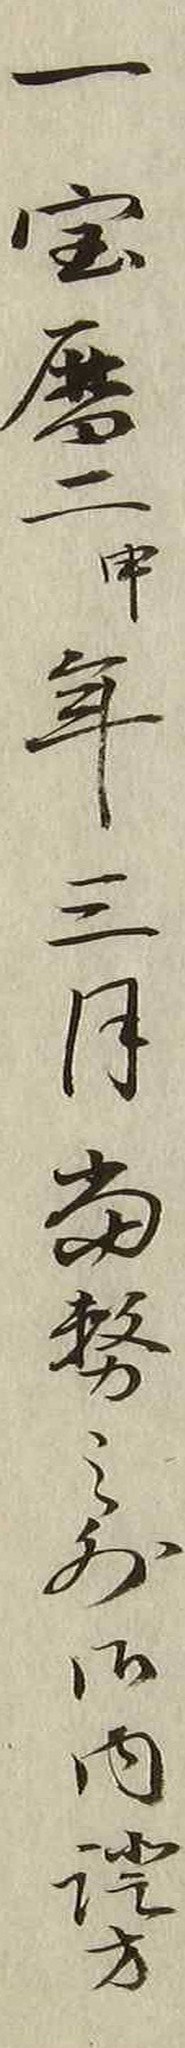一宝暦二申年三月当努之外御内證方
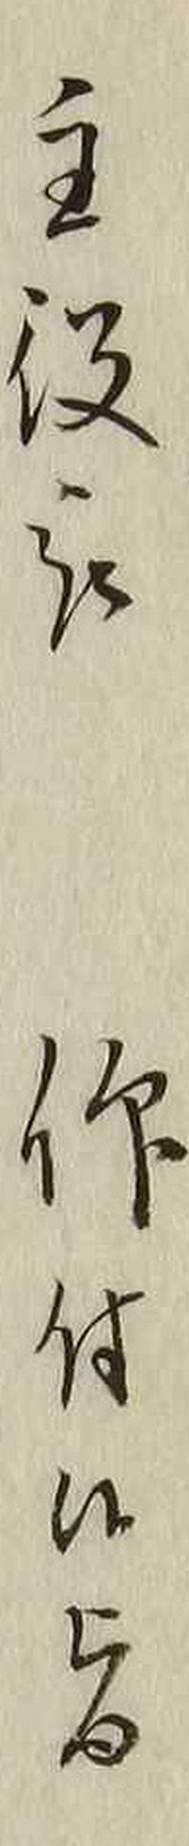主役被仰付候旨
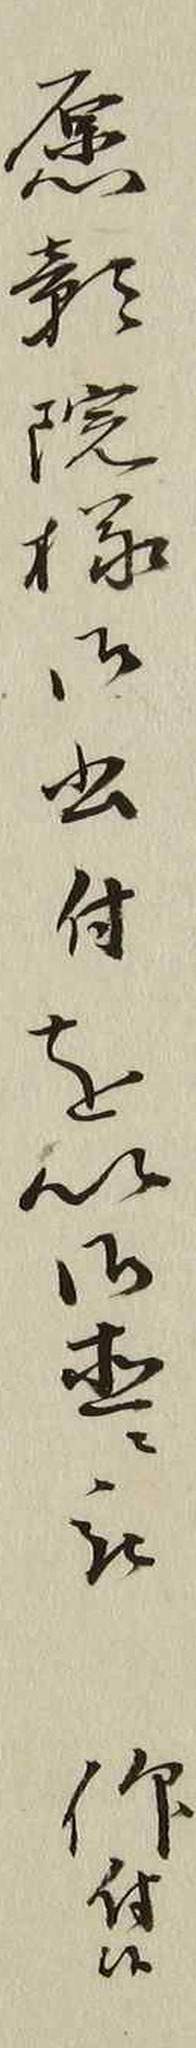愿彰院様御書付を以て御直ニ被仰付候
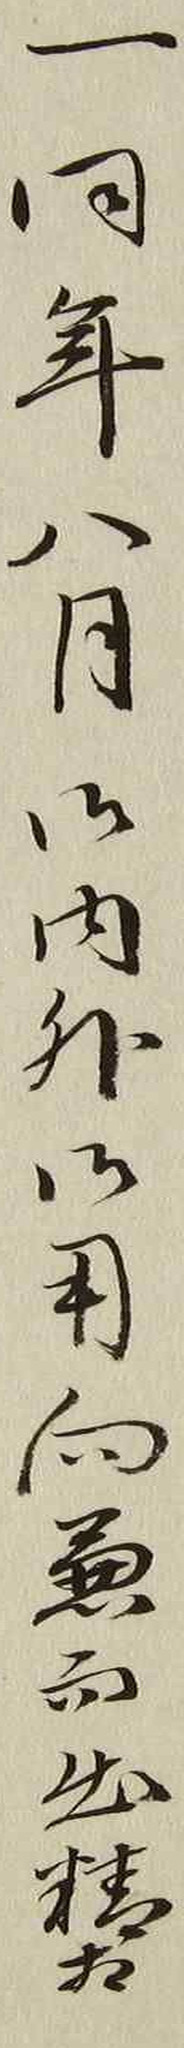一同年八月御内外御用向兼而出精相
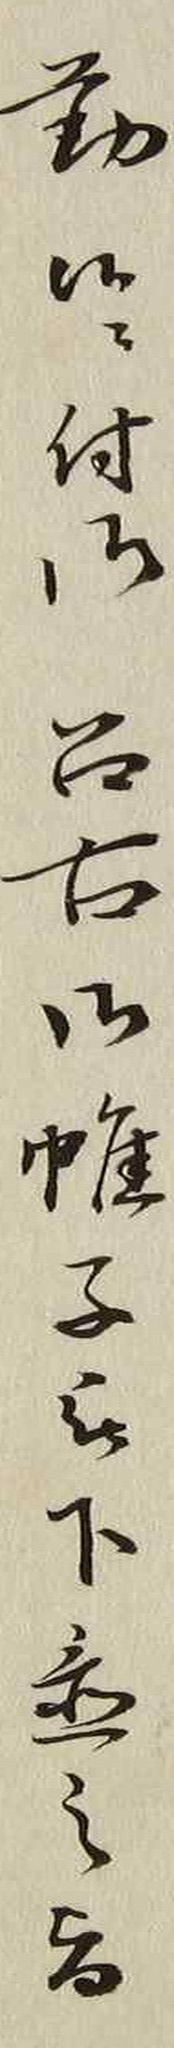勤め候ニ付御召し古御帷子被下置候旨
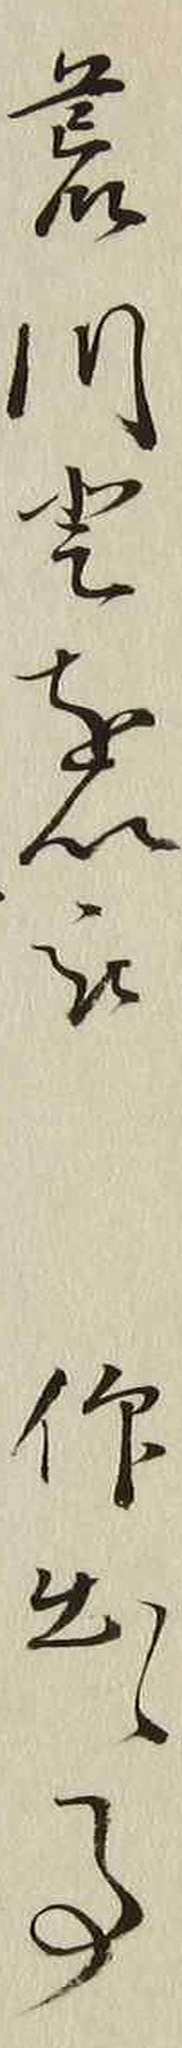荒川登を以被仰出候事
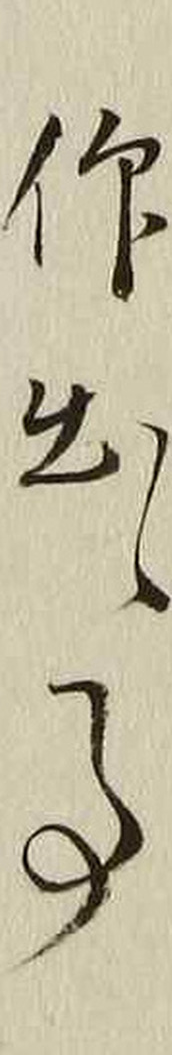仰渡候事
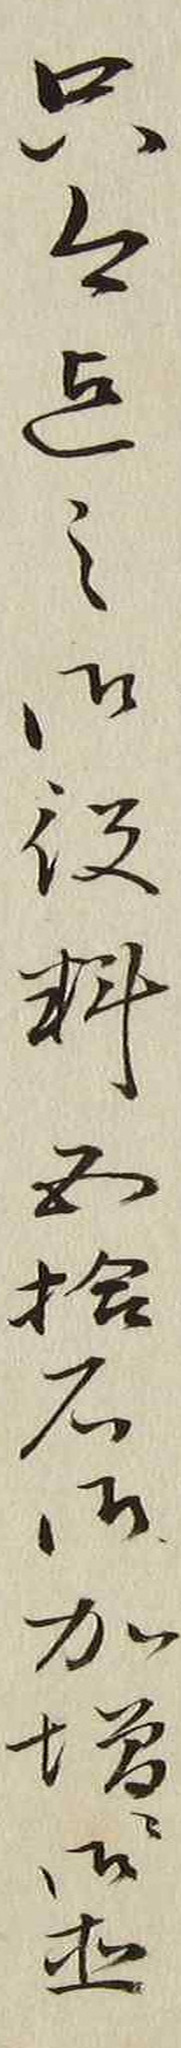只今迄之御役料五拾石御加増ニ御直
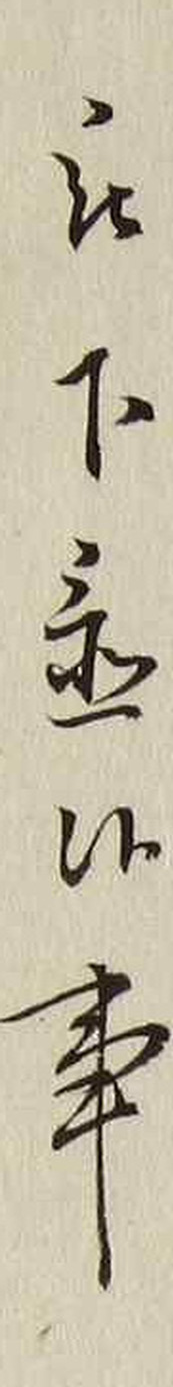被下置候事
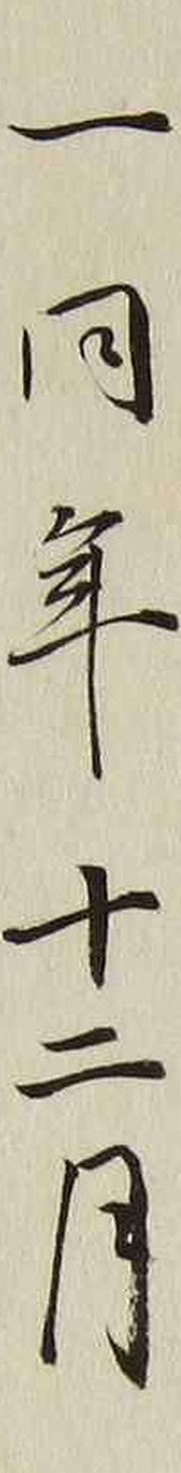一同年十二月
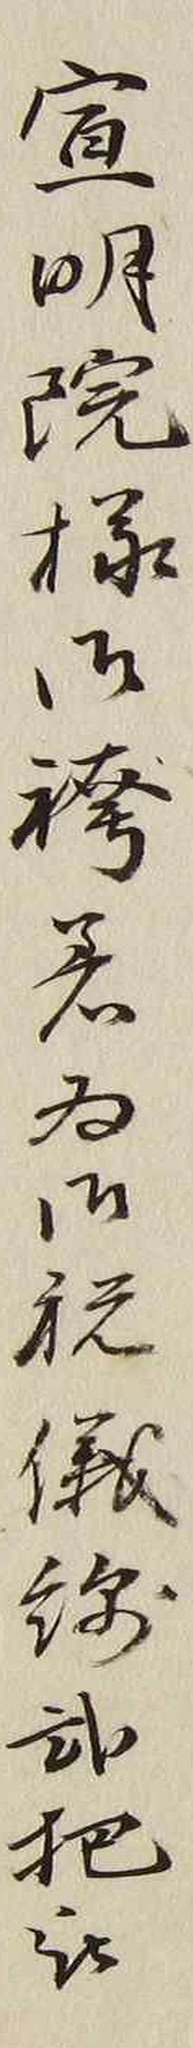宣明院様御袴着為御祝儀綿弐把被
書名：諸士系譜　巻之19　い之部19
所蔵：会津若松市立会津図書館
